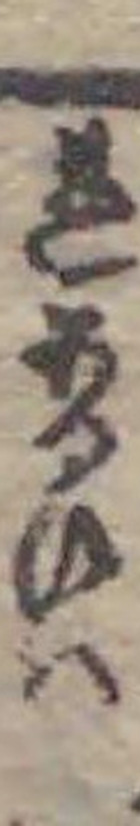れあるひは
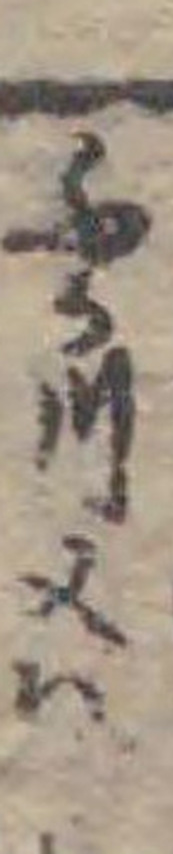ふか川又は
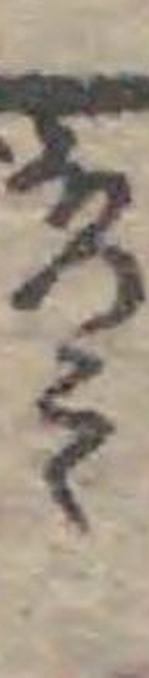ほつこく
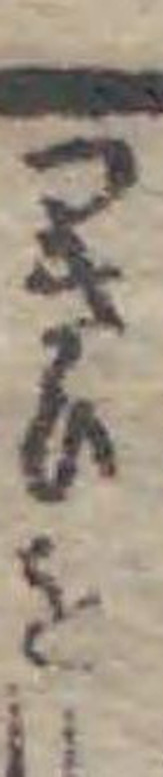つきひを
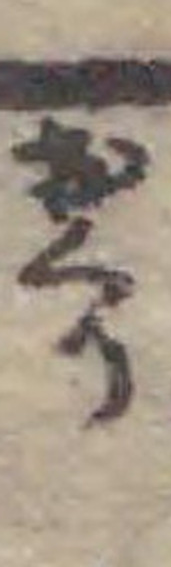おくり
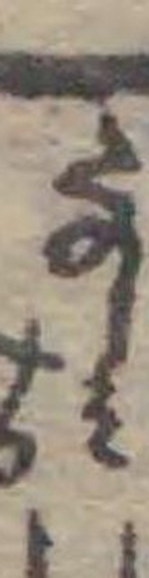たのしみ
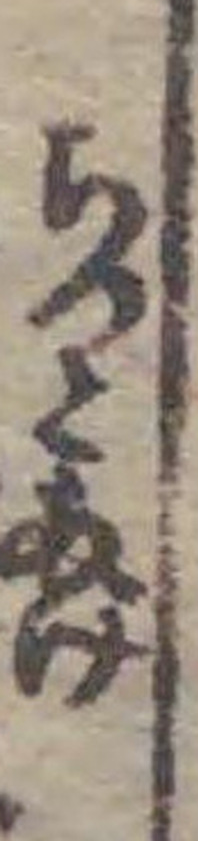ちつとあげ
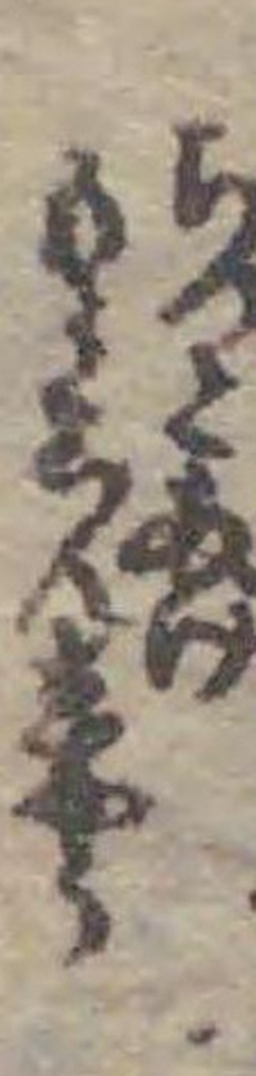もみらんしやう
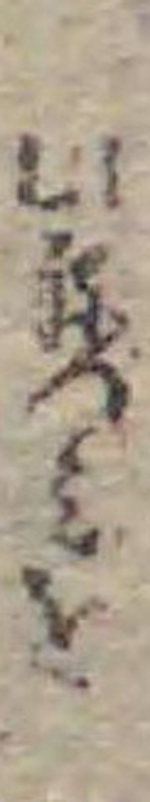此ねづみを

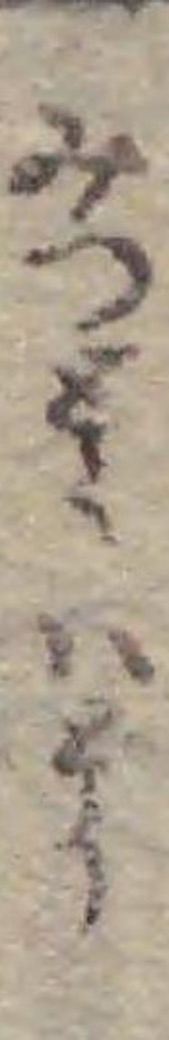みつとうはとう
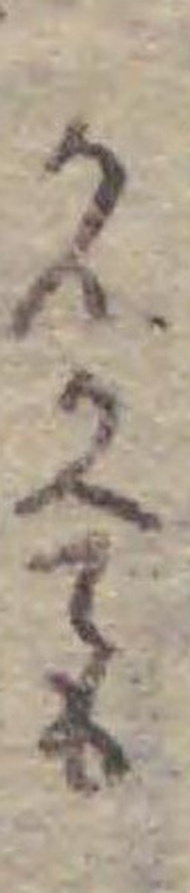かんかへても
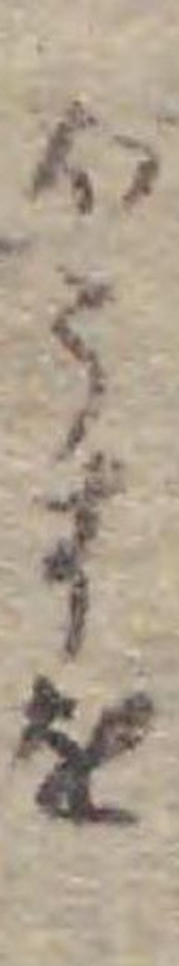ぼうすを
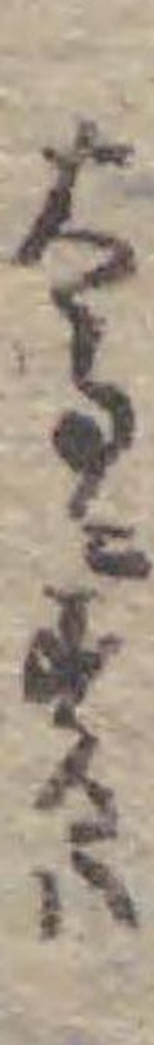大事にするは
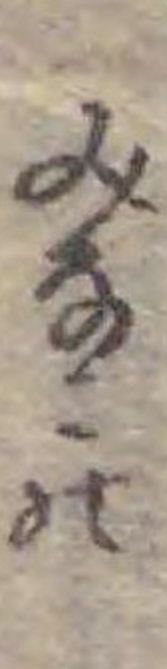みなこの
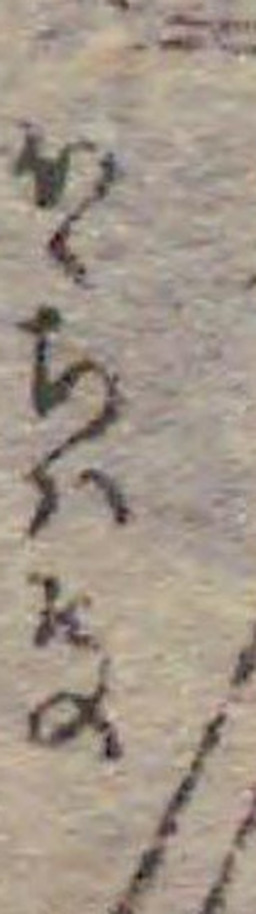ほくちはその
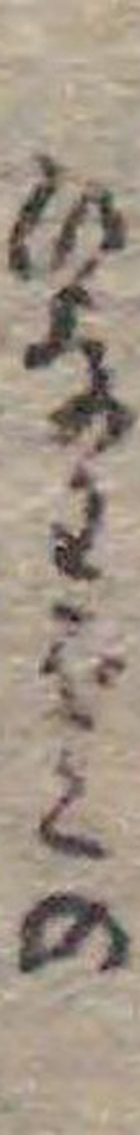ひなわばこの
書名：[化物一代記] : 5巻
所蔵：国立国会図書館 National Diet Library, JAPAN
